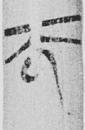而
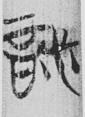○（谧）
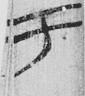于
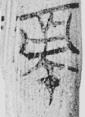帝
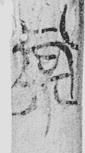○（嘗）
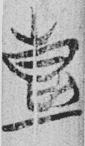彭
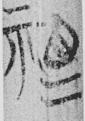祖
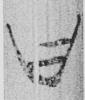曰
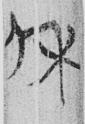休
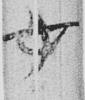才（哉）
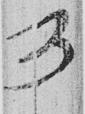乃
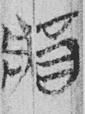𨟻（將）
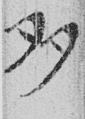多
